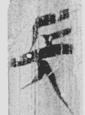○（路）
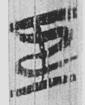巨（蘧）
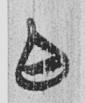白（伯）
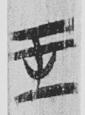玉
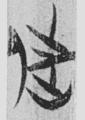○（止）
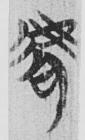○（乎）
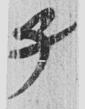子
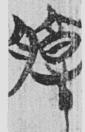○（惇）
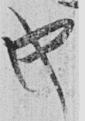女（如）
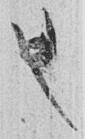也
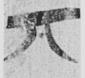亓（其）
